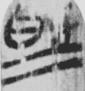爲
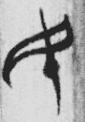民
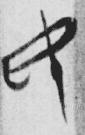女（如）
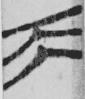天
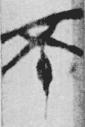不
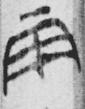雨
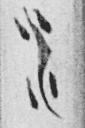水
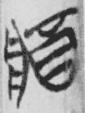𨟻（將）
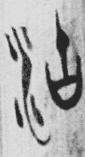沽（涸）
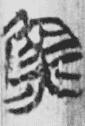魚
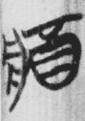𨟻（將）
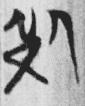死
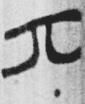亓（其）
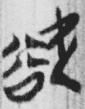欲
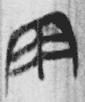雨
